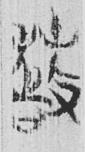{艸告攴}（曹）
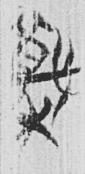{𦭝戈禾}（沫）
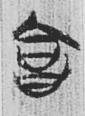合
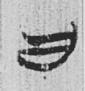曰
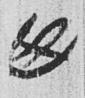臣
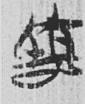䎽（聞）
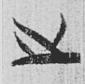之
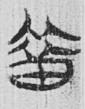昔
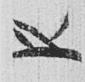之
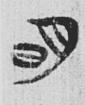明
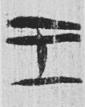王
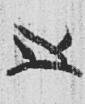之
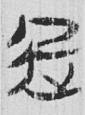○（起）
